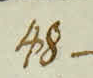48
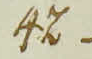42
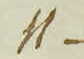11
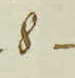8
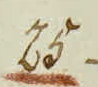25
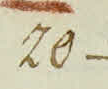20
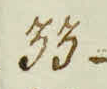33
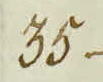35
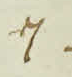7
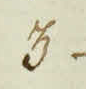3
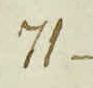71
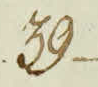39
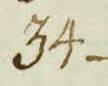34
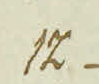12
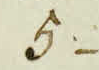5
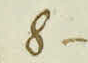8
